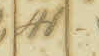41
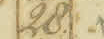28.
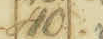40.
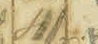41
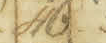46.
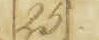25
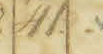41.
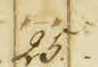25.
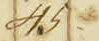45
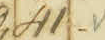41
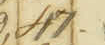47
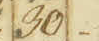30
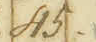45
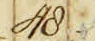48
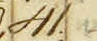41.
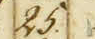25.
